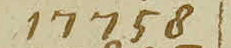17758
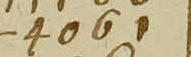4061
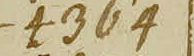4364
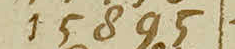15895
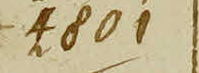4801
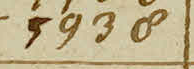5938
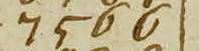7566
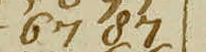6787
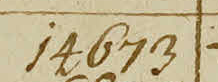14673
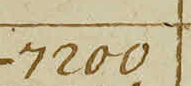7200
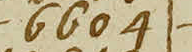6604
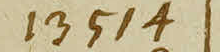13514
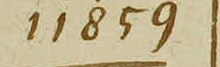11859
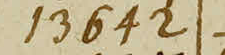13642
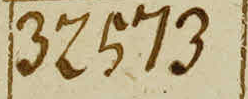32573
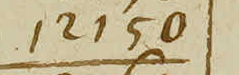12150
